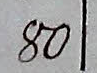80
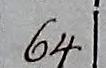64
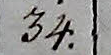34.
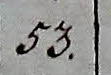53.
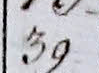39
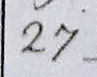27
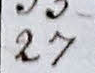27
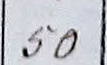50
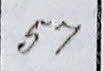57
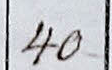40
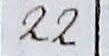22
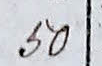50
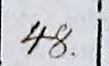48.
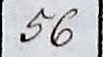56
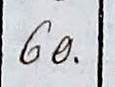60.
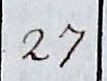27
